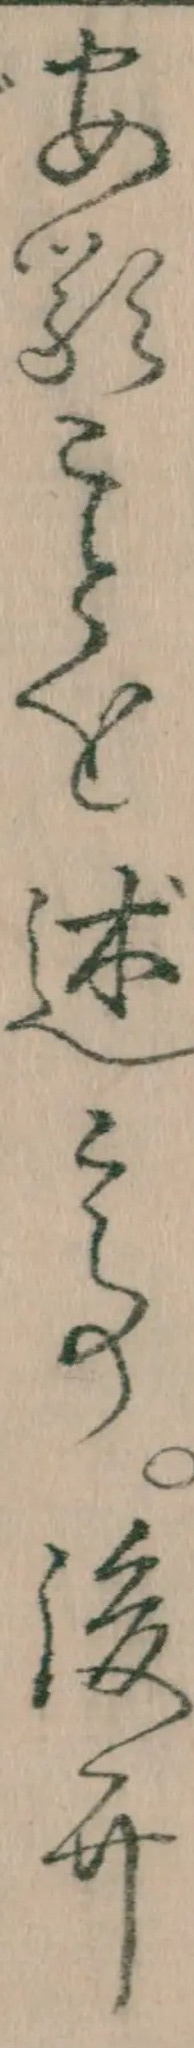あることを述て。後に
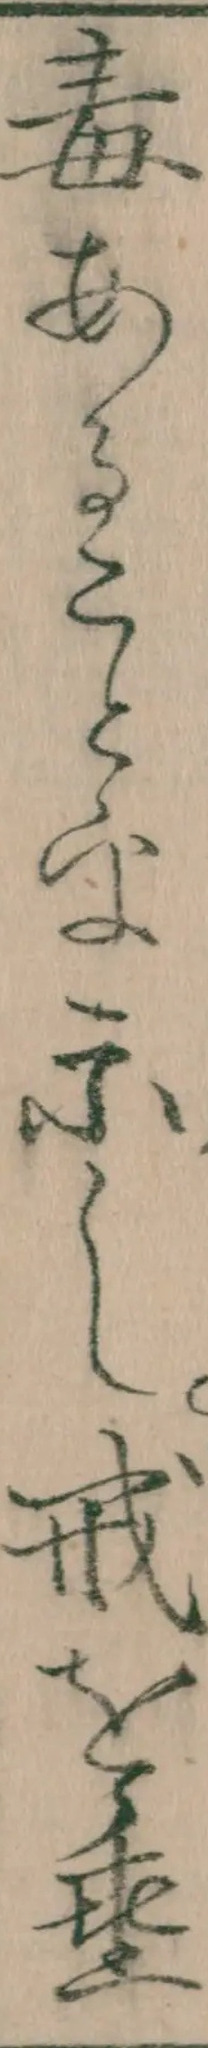毒あることを示し。戒を垂
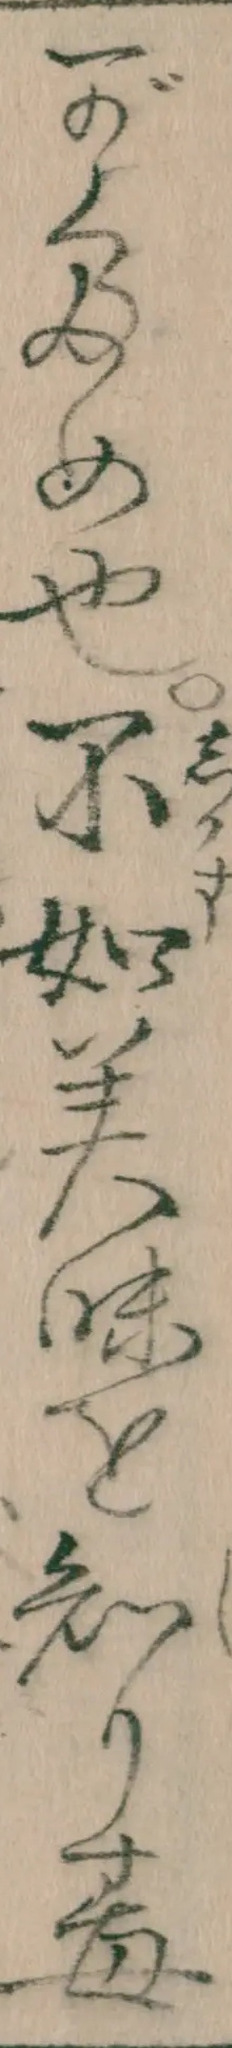がため也。不如美味を知り毒
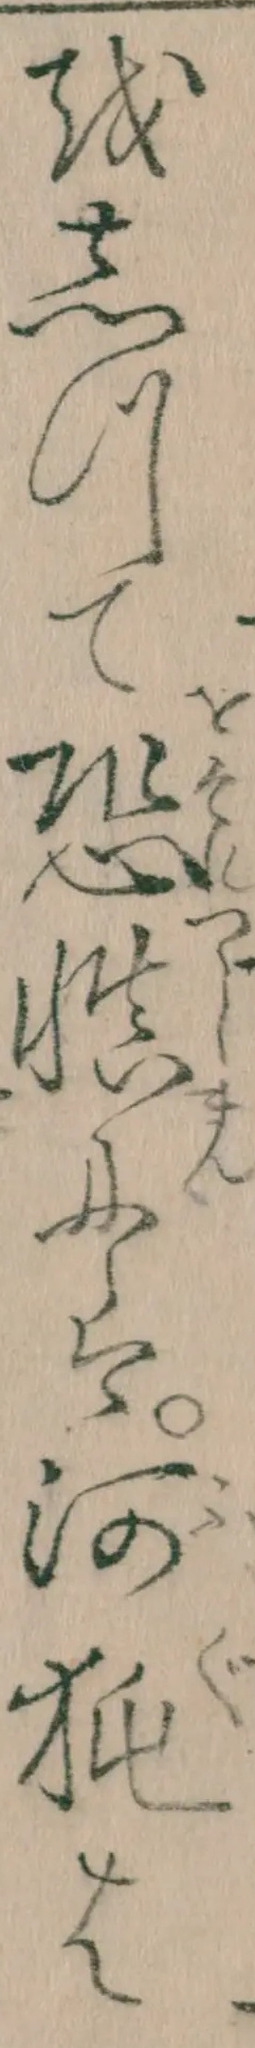をしつて恐慎には。河㹠は
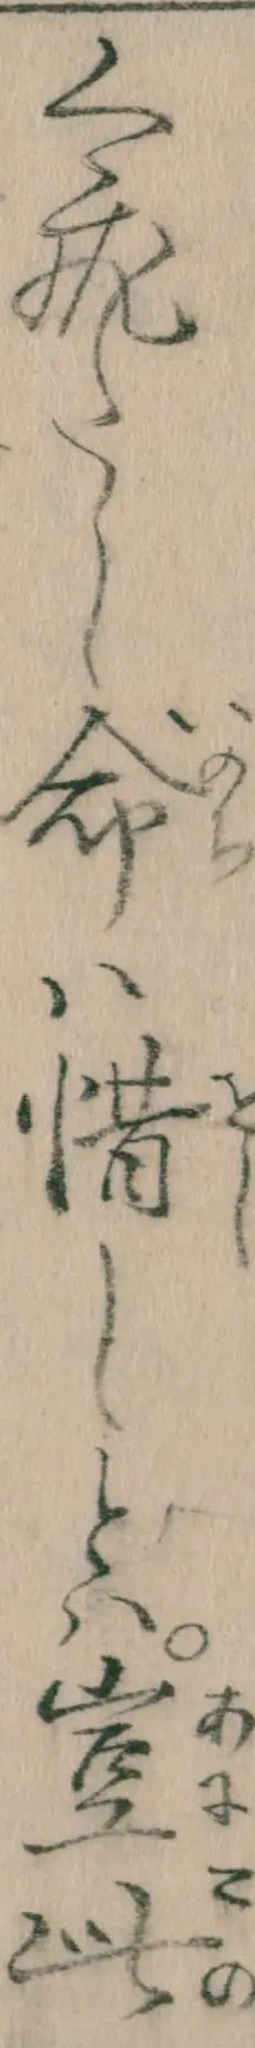くひたし命は惜しとは。豈此
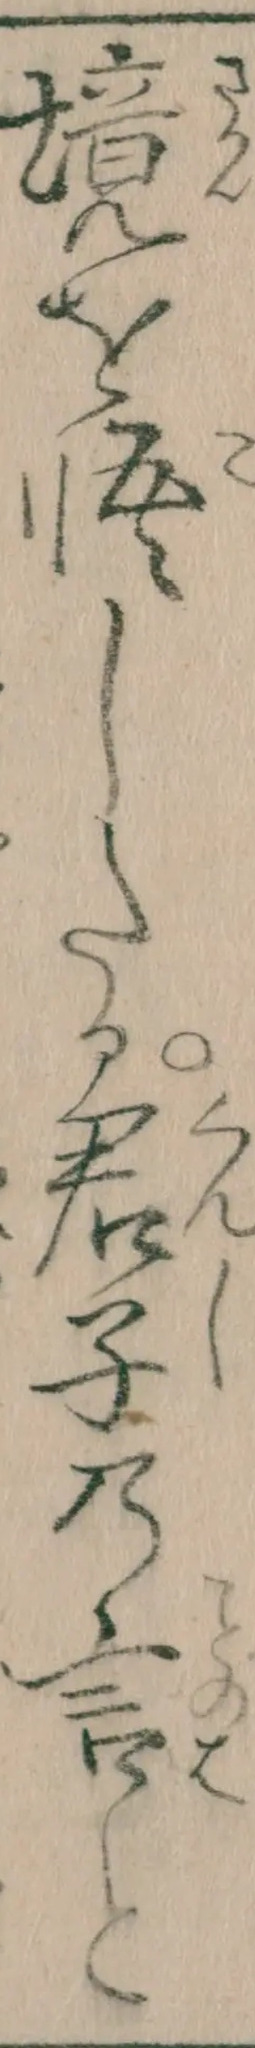境を悟したる。君子の言と
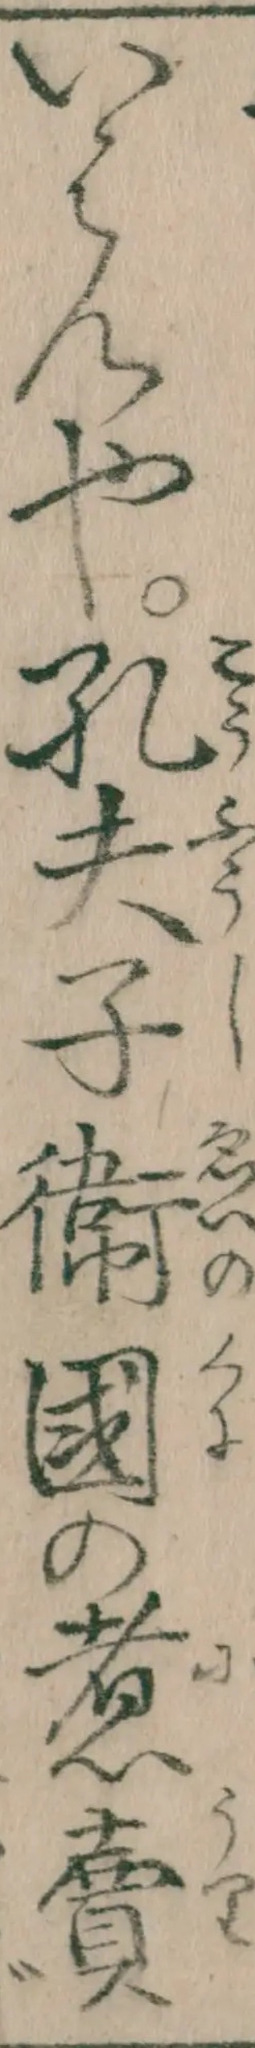いはんや。孔夫子衛国の煮売
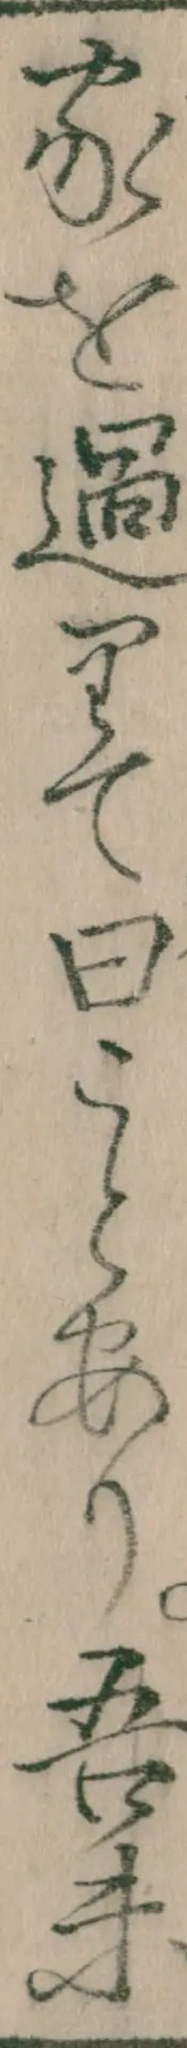家を過りて曰ことあり。吾未

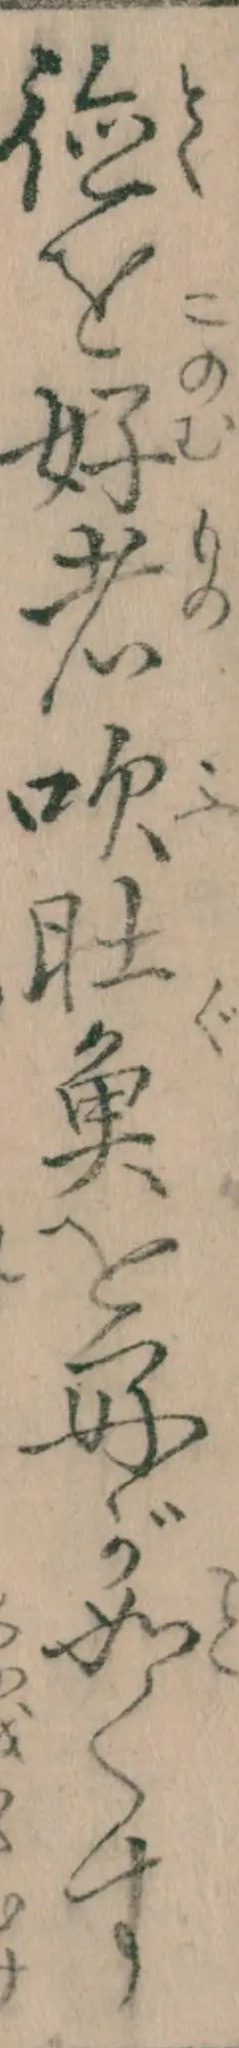徳を好者吹肚魚を好が如くす
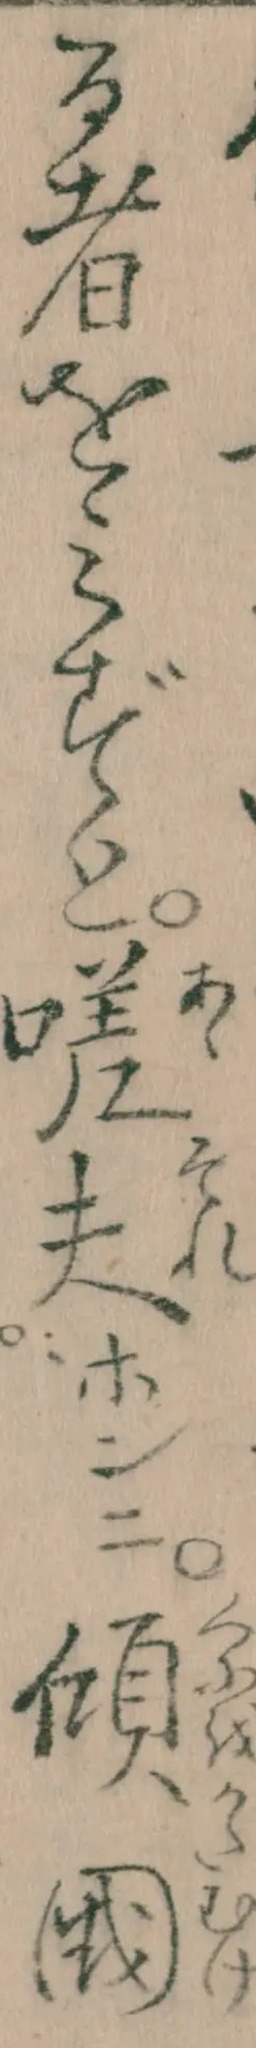る者をみずと。嗟夫ホンニ。傾国
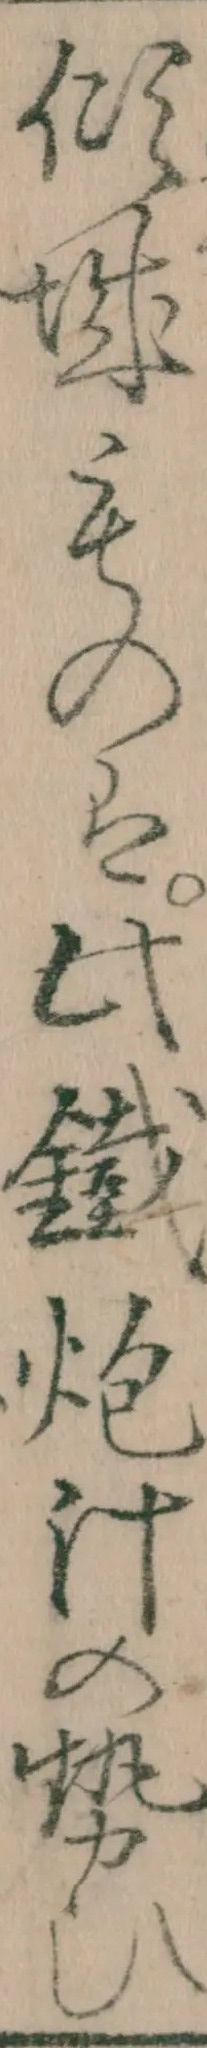傾城ものは。此鉄炮汁の勢ひ
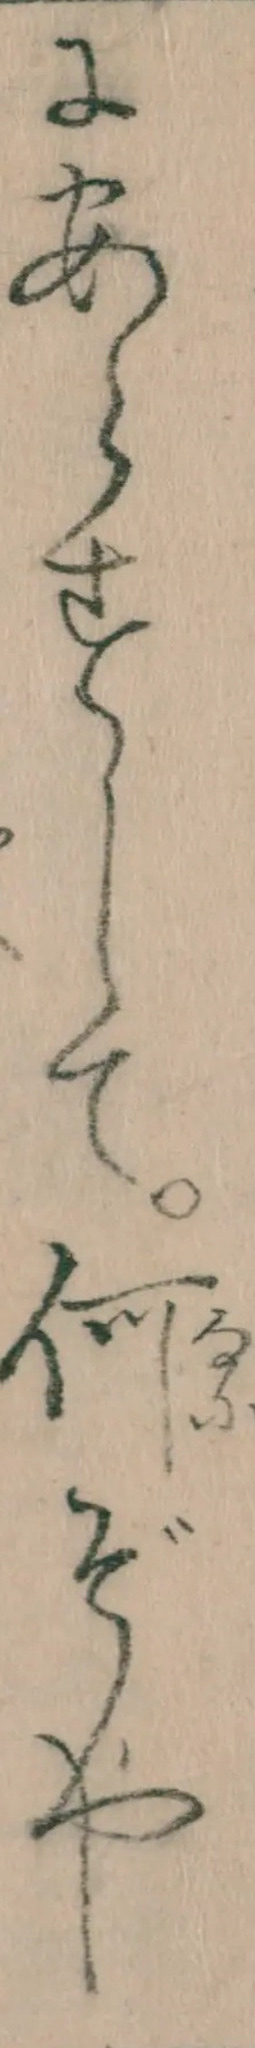にあらすして。何ぞや
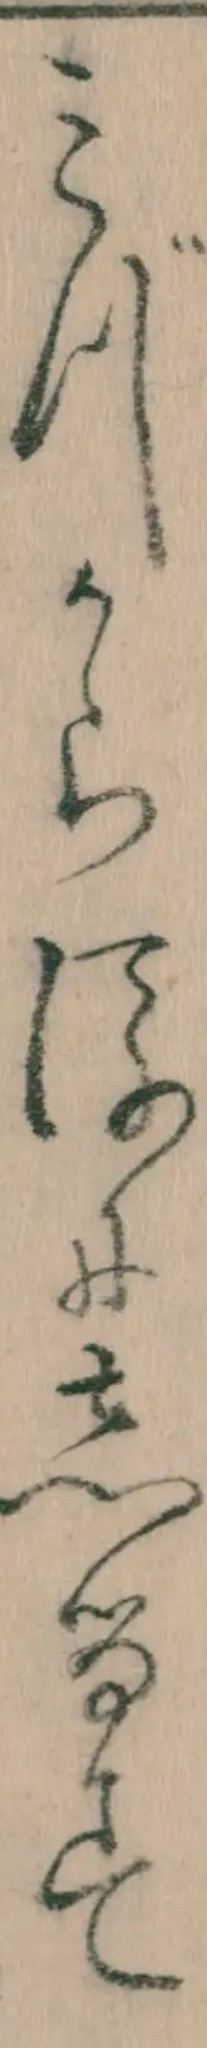みづから後にしるす
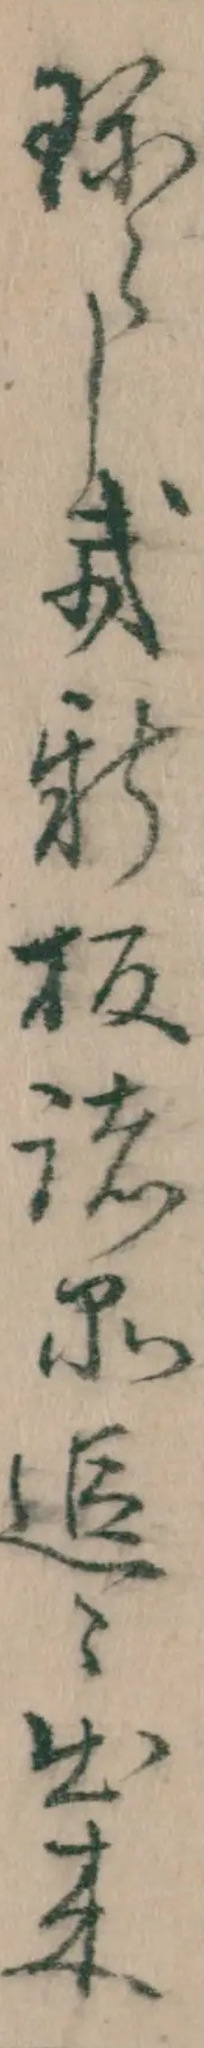珍らしき新板諸品追々出来
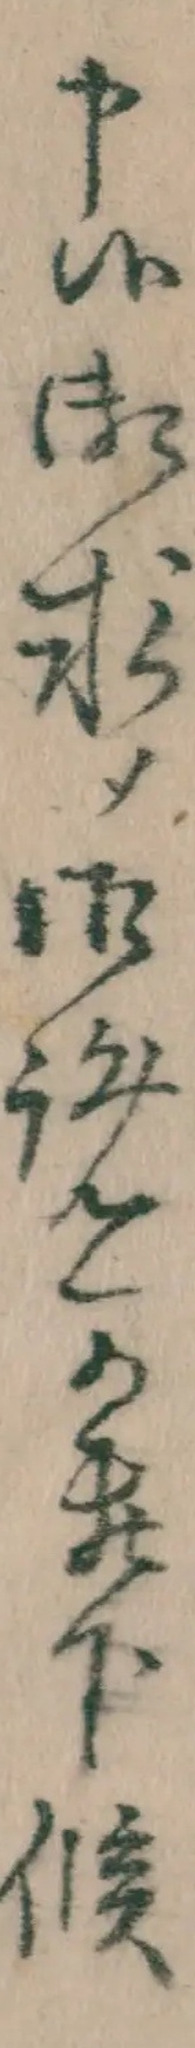申候御求御覧可被下候
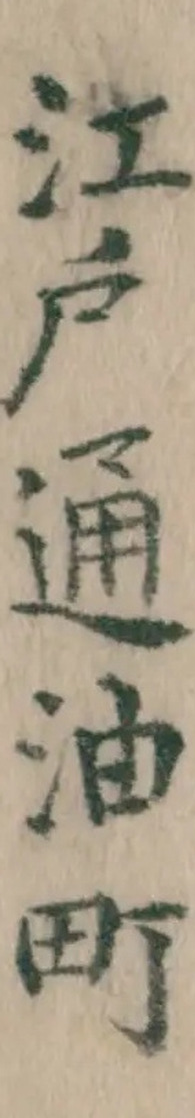江戸通油町
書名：教訓読本：大礒風俗仕懸文庫
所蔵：国立国会図書館 National Diet Library, JAPAN
